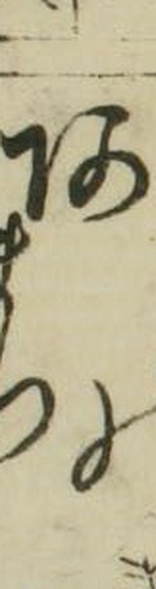あまり
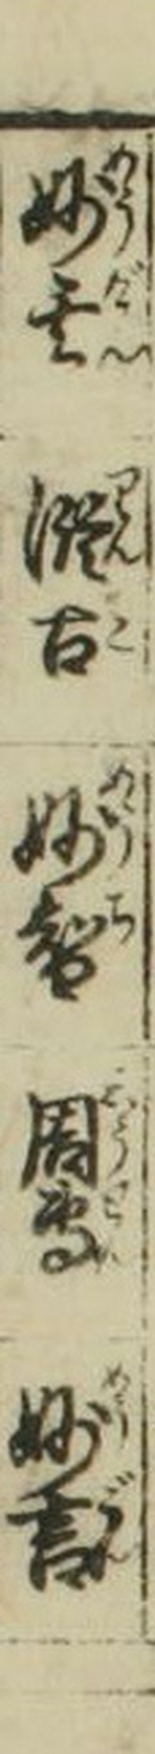妙玄臨古妙智周専妙言
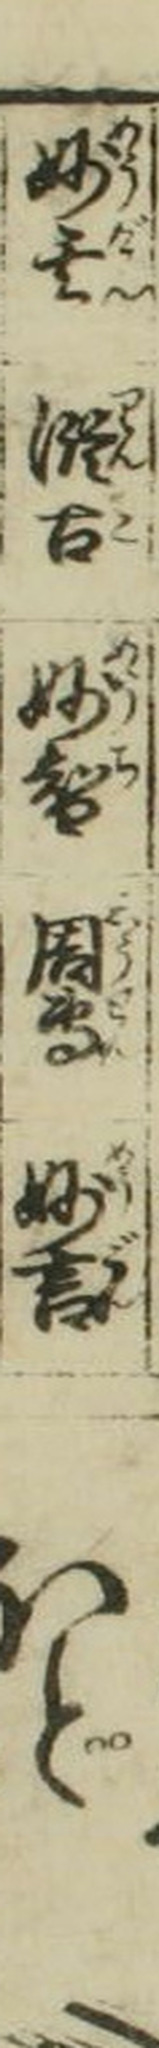妙玄臨古妙智周専妙言
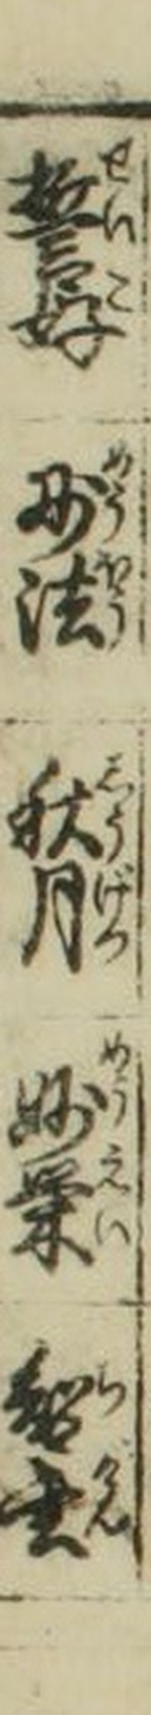誓好妙法秋月妙栄智玄
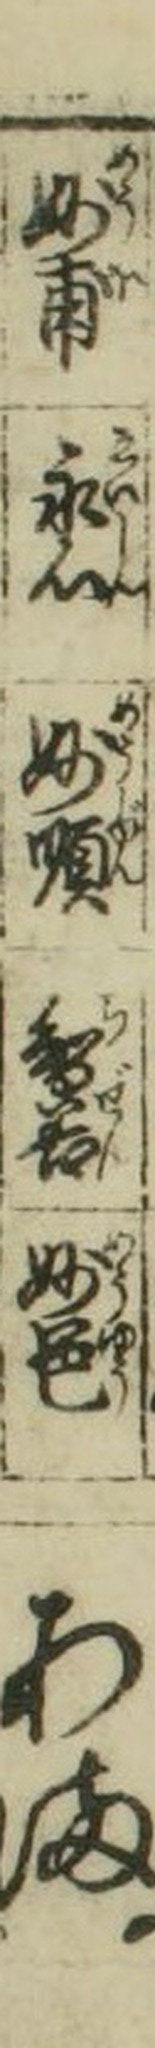妙甫永心妙順智善妙邑
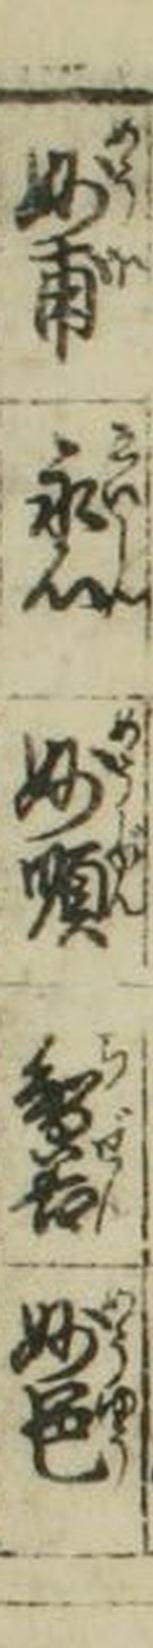妙甫永心妙順智善妙邑
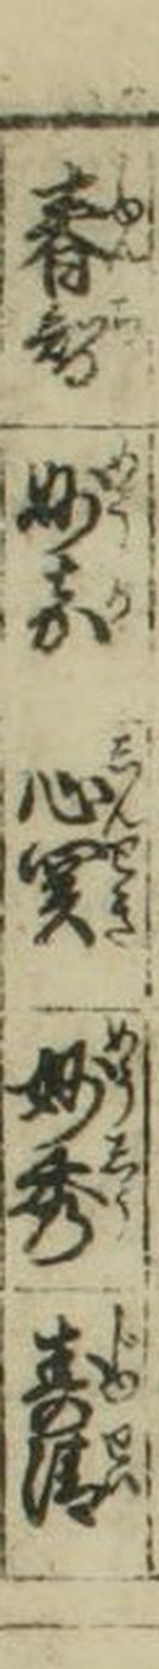春智妙嘉心関妙秀寿清
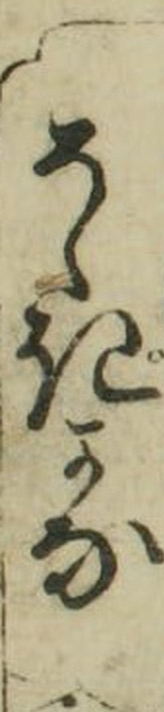そゝぎかな

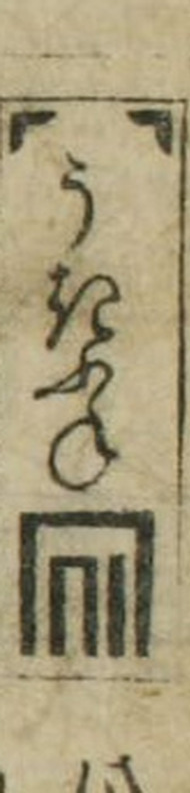うきふね
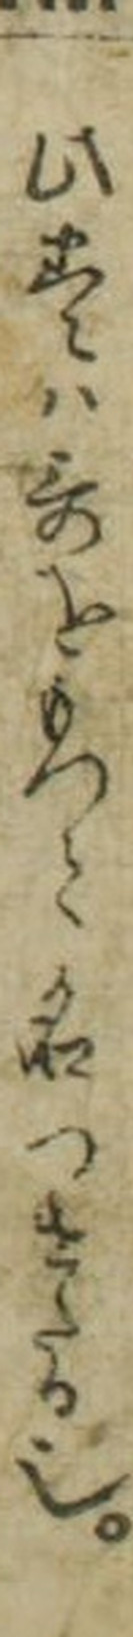此巻は哥をもつて名つけたる也。
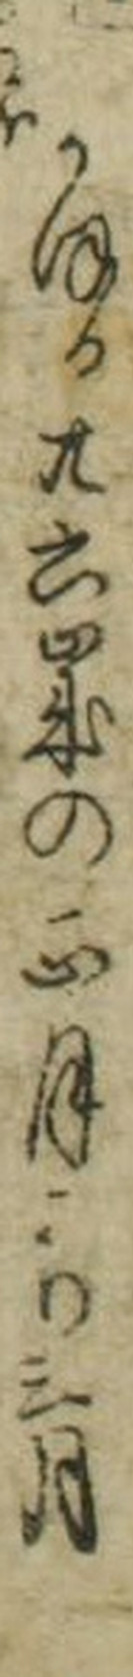かほる廿六歳の正月より三月
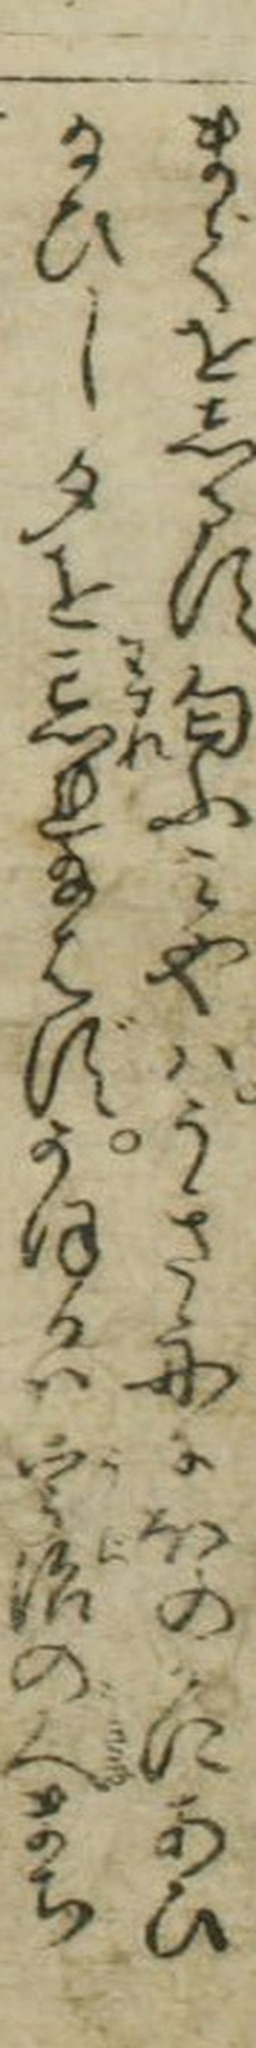給ひし夕を忘れ給はず。かほるは宇治の人まち
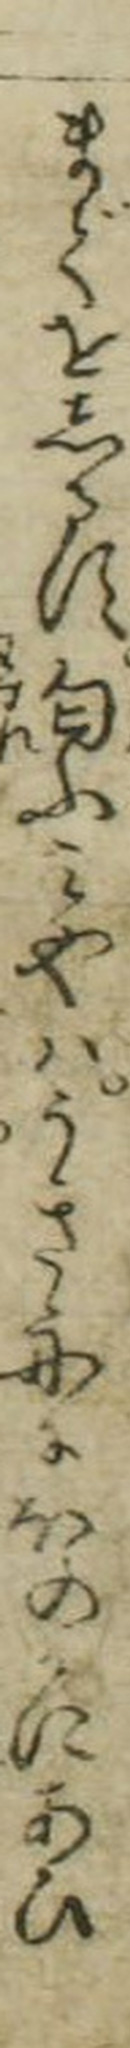までをしるす。匂ふみやは。うき舟にほのかにあひ
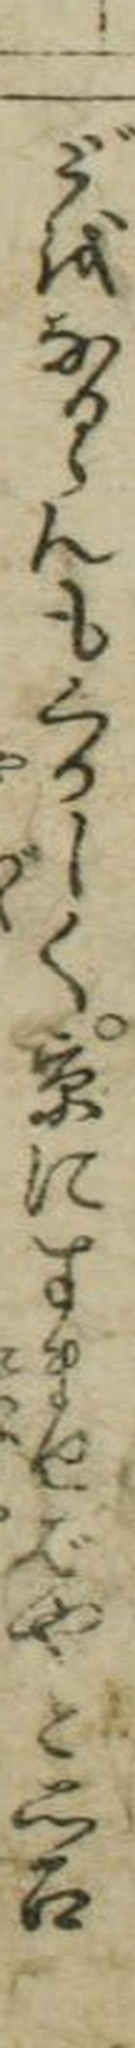どをなるらんもくるしく。京にすませばやと思召
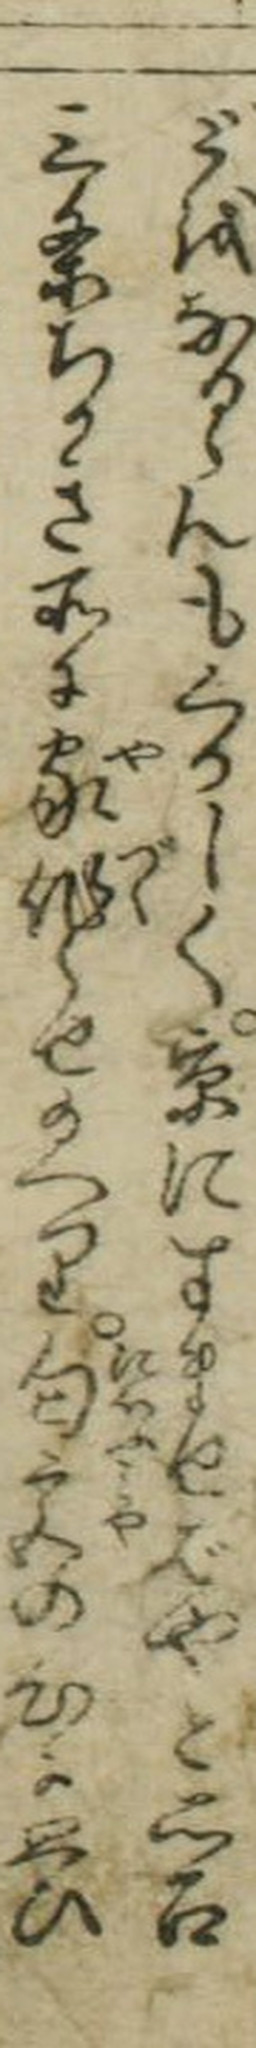三条ちかき所に家作らせ給へり。匂宮の心に思ひ
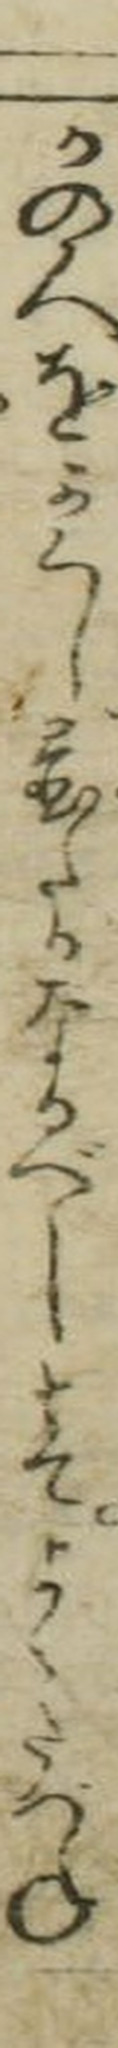かの人をかくし置たるなるべしとて。よくたづね
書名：女源氏教訓鑑
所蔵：東京学芸大学附属図書館
